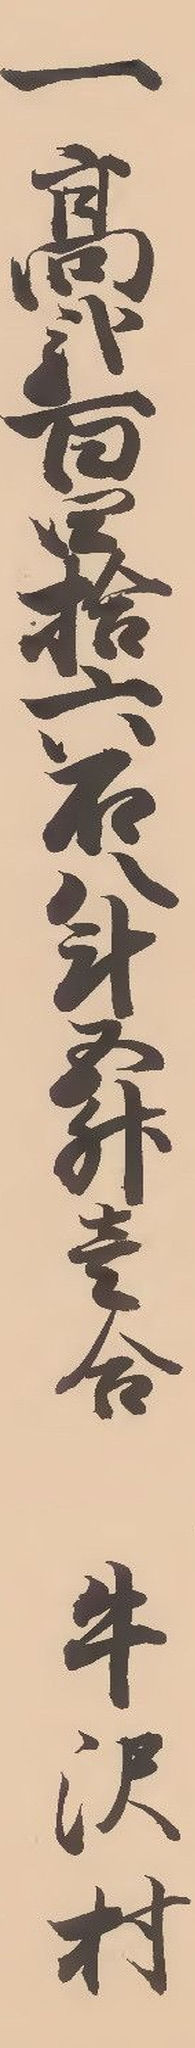一高弐百四拾六石八斗五升壱合牛沢村
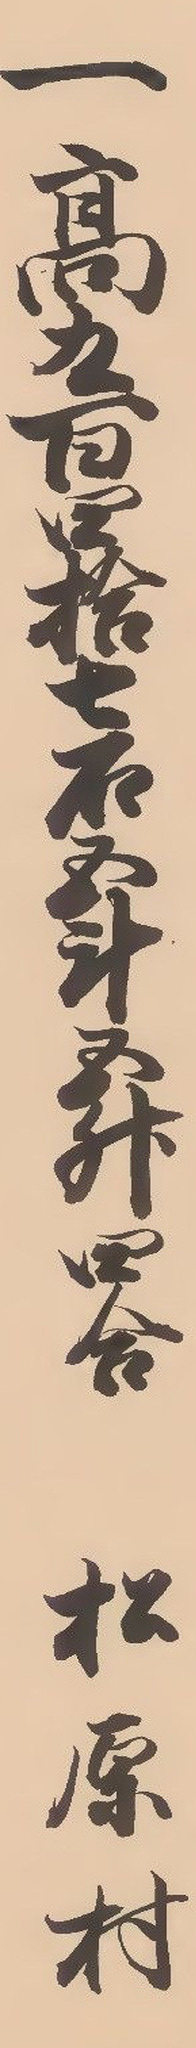一高九百四拾七石五斗五升四合松原村
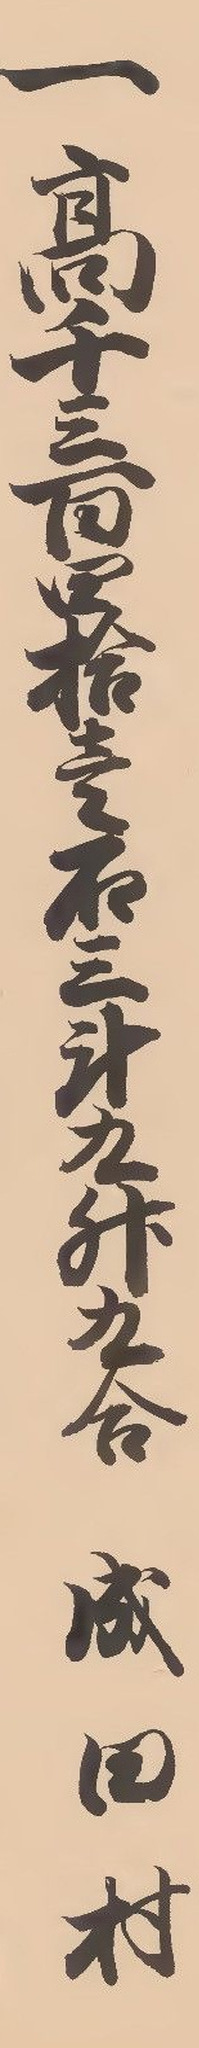一高千三百四拾壱石三斗九升九合成田村
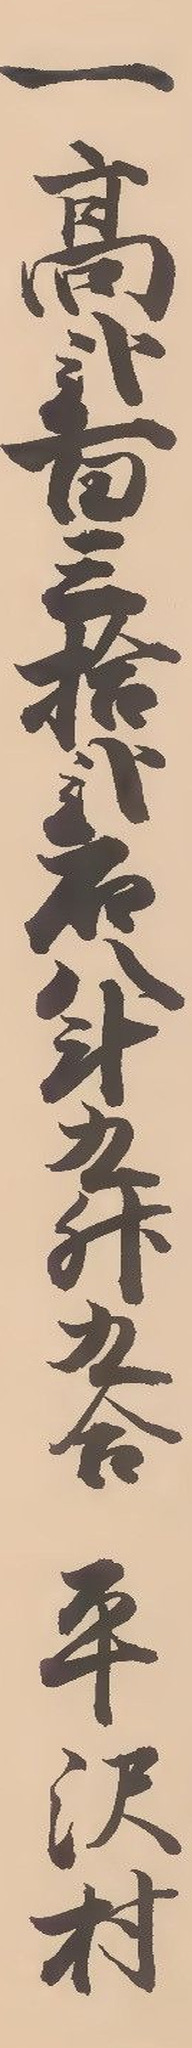一高弐百三拾弐石八斗九升九合平沢村
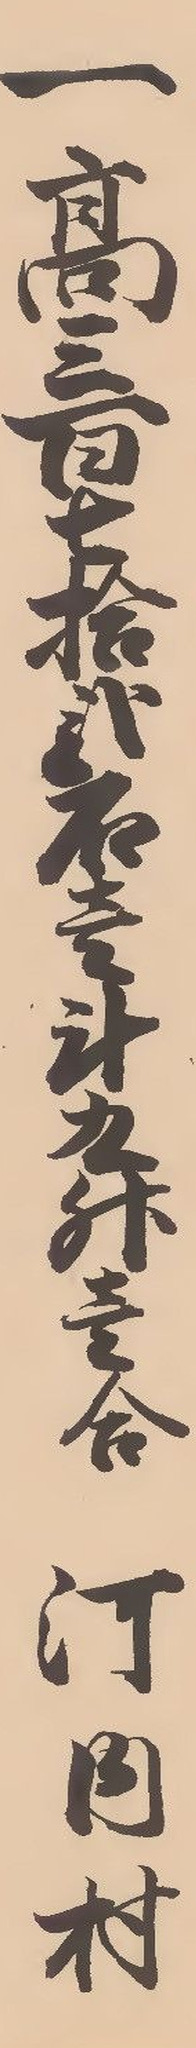一高三百七拾弐石壱斗九升壱合河内村
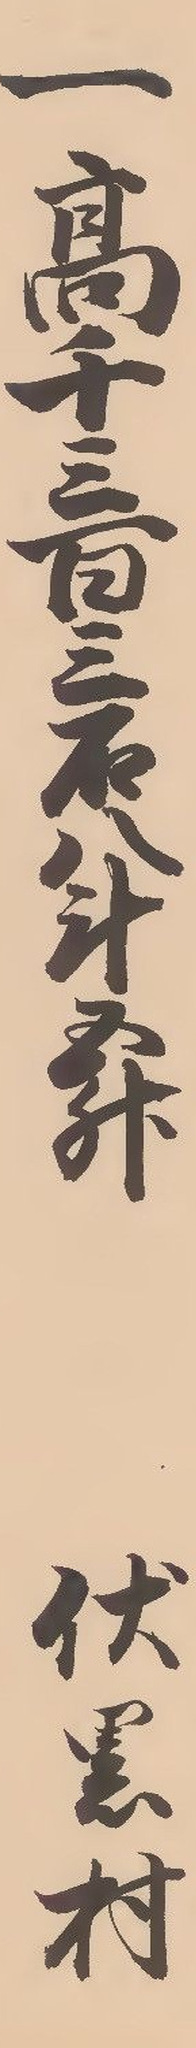一高千三百三石八斗五升伏黒村
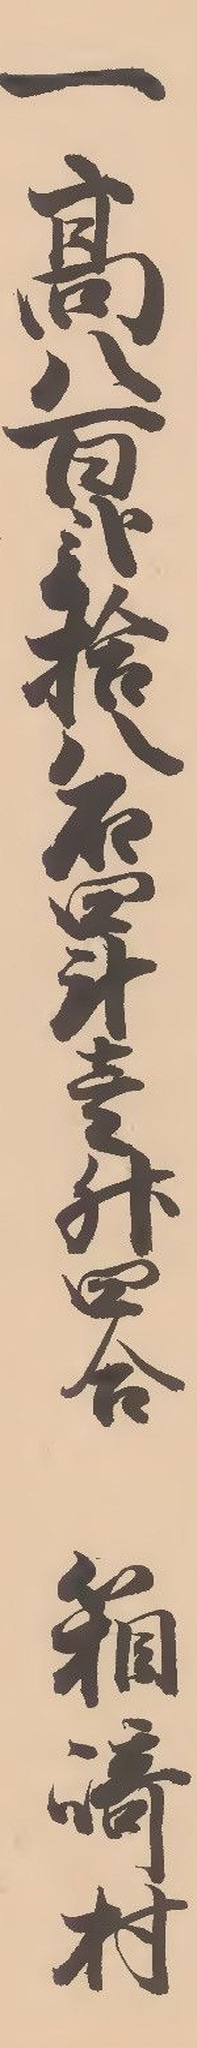一高八百弐拾八石四斗壱升四合箱崎村

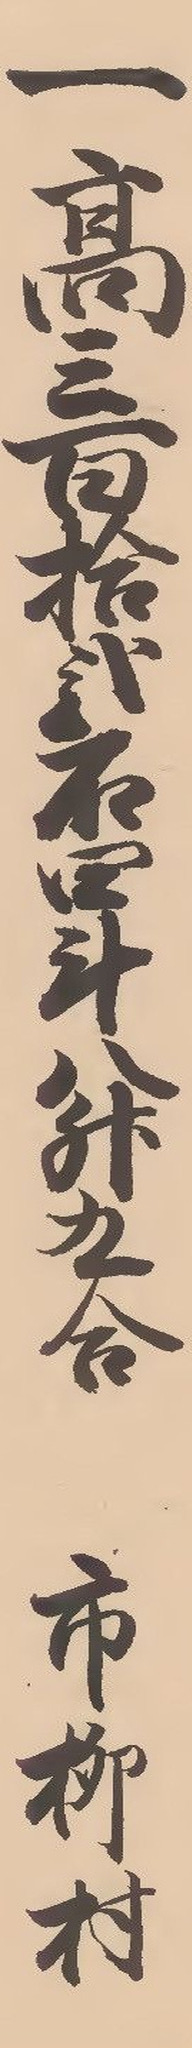一高三百拾弐石四斗八升九合市柳村
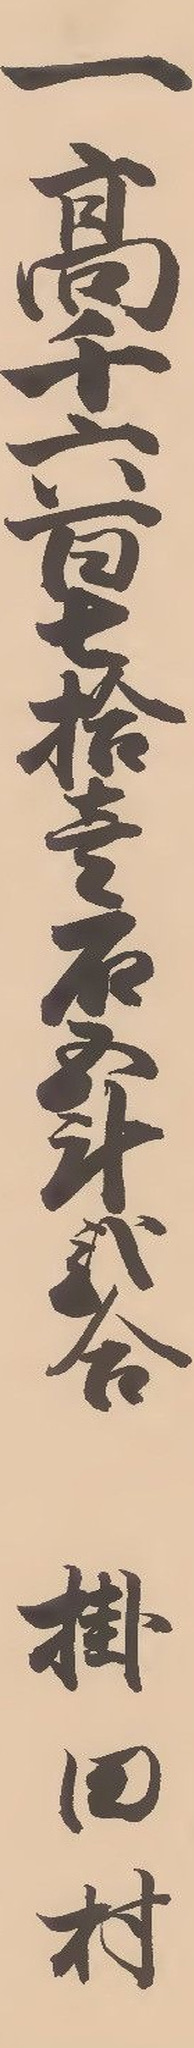一高千六百七拾壱石五斗弐合掛田村
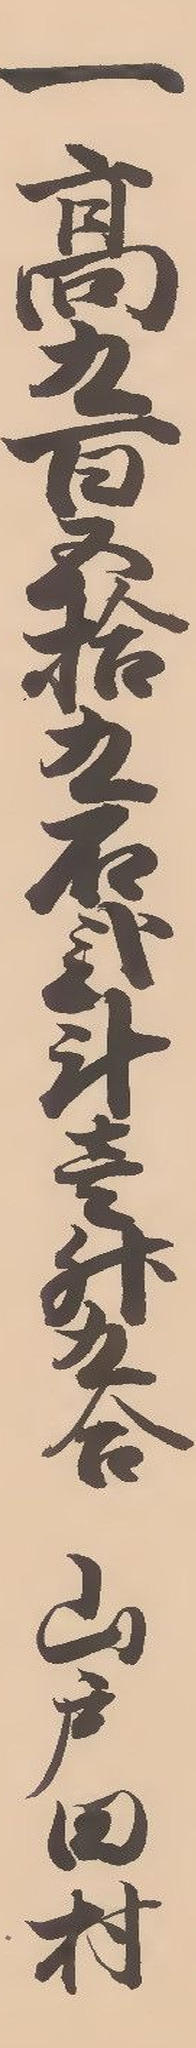一高九百五拾九石弐斗壱升九合山戸田村
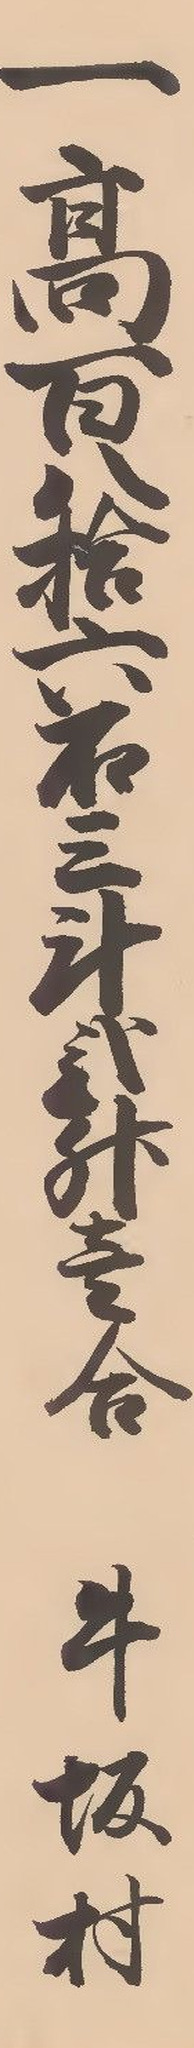一高百八拾六石三斗弐升壱合牛坂村
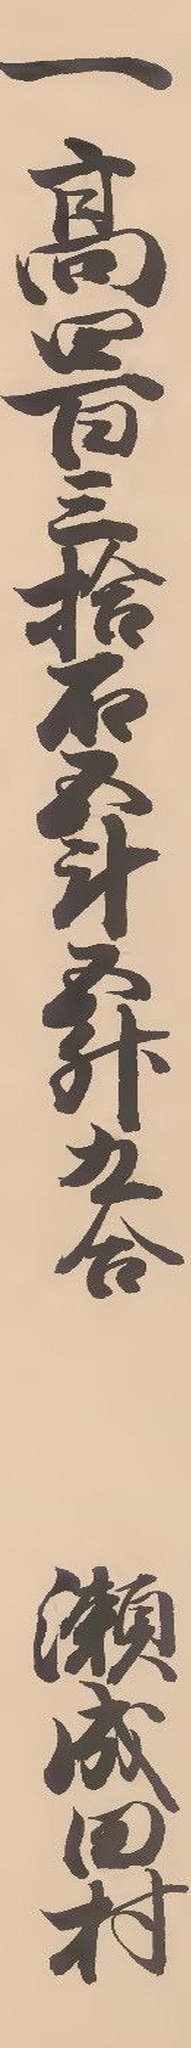一高四百三拾石五斗五升九合瀬成田村
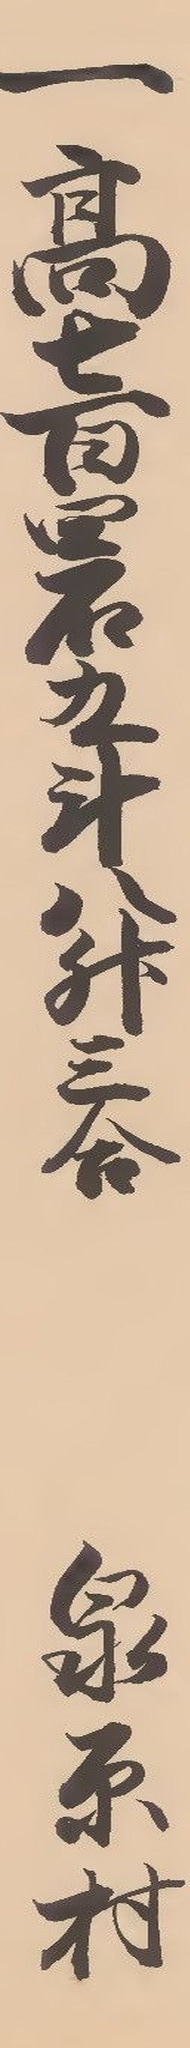一高七百四石九斗八升三合泉原村
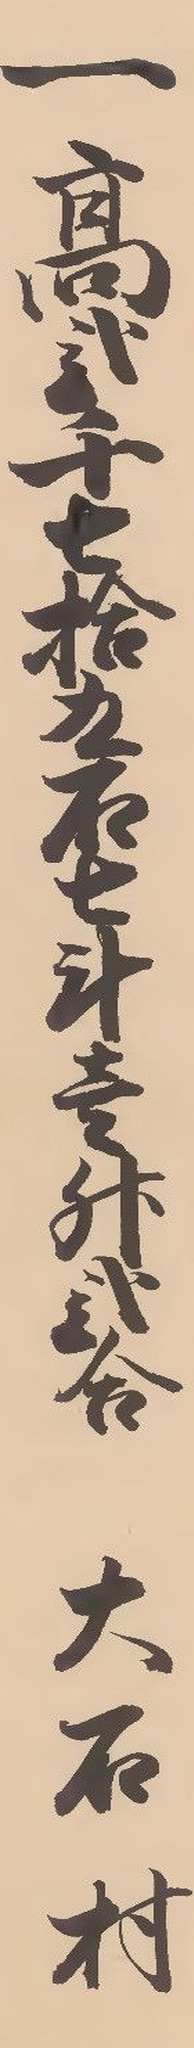一高弐千七拾九石七斗壱升弐合大石村
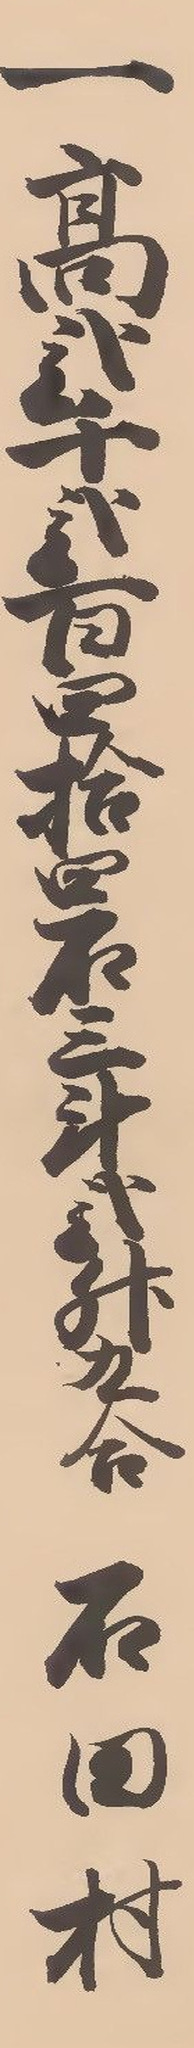一高弐千弐百四拾四石三斗弐升九合石田村

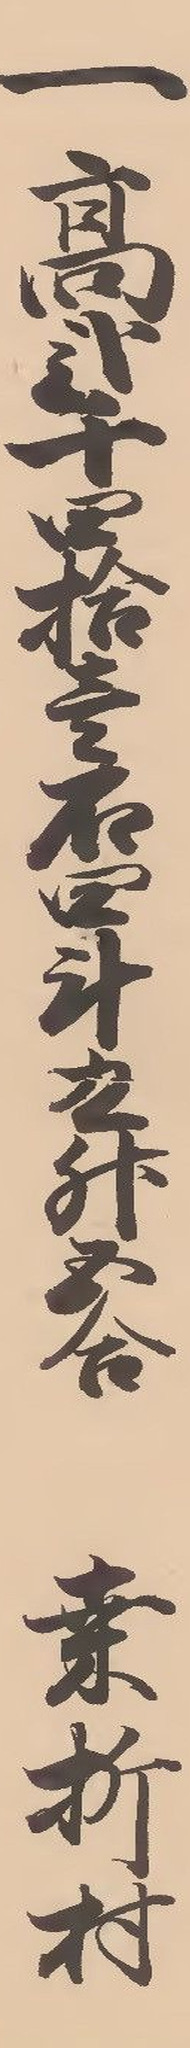一高弐千四拾壱石四斗九升五合桑折村
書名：陸奥国郷帳　４
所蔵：国立公文書館 National Archives of Japan
